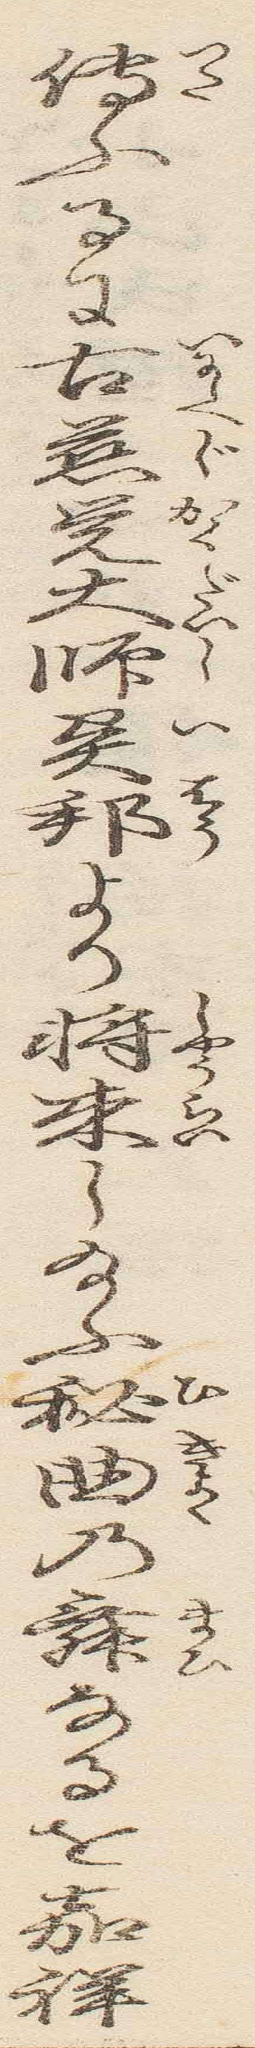傳ふるに古慈覚大師異邦より将来し給ふ秘曲の舞なるを嘉祥
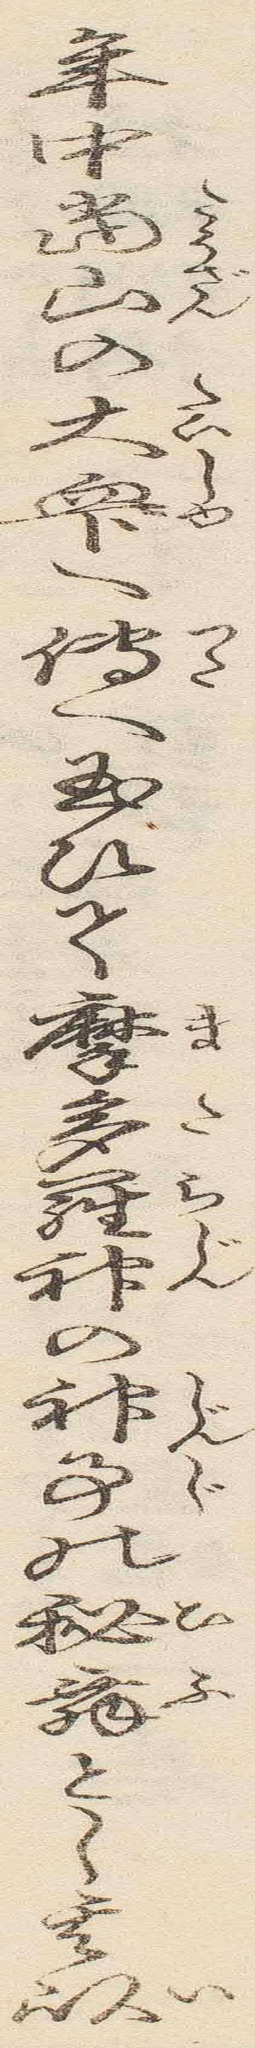年中當山の大衆へ傳へ玉ひて摩多羅神の神事の秘舞とし其以
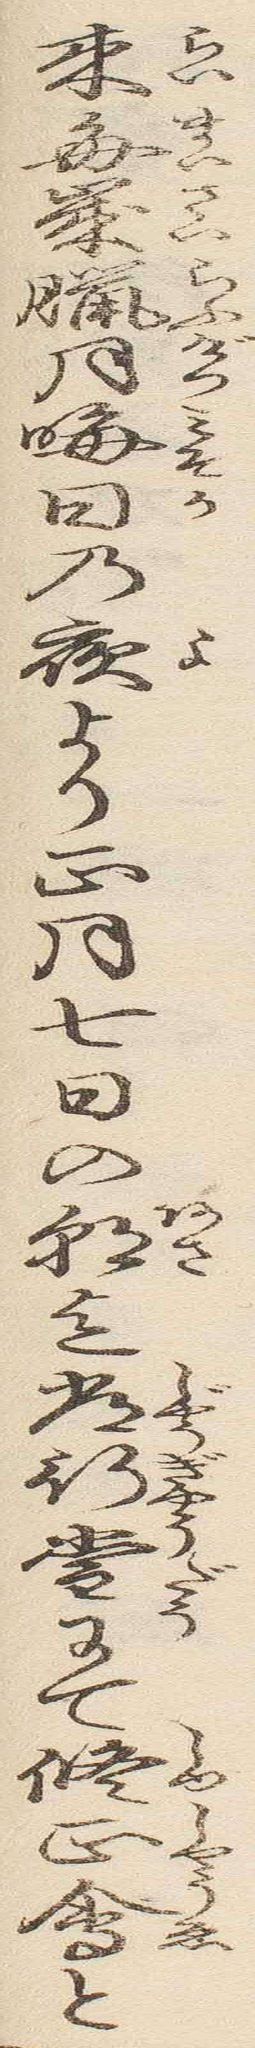来毎歳臘月晦日の夜より正月七日の朝迄常行堂にて修正會と
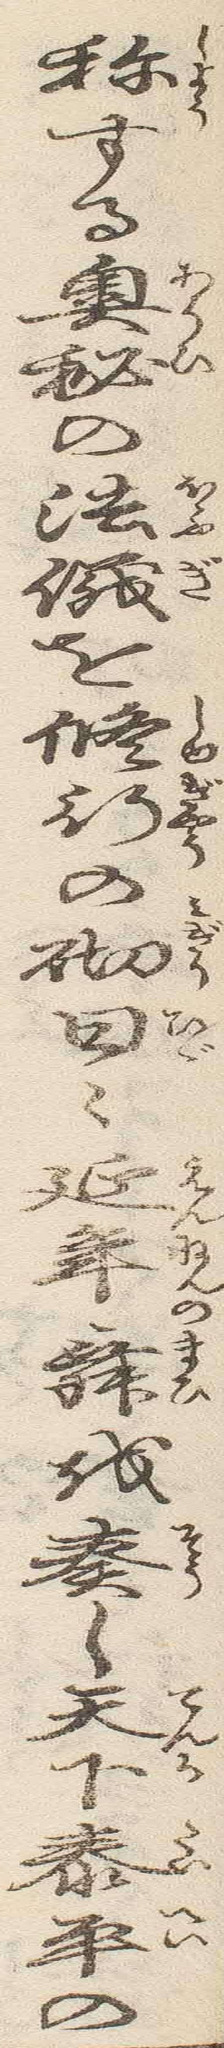称する奥秘の法儀を修行の砌日〻延年舞を奏し天下泰平の
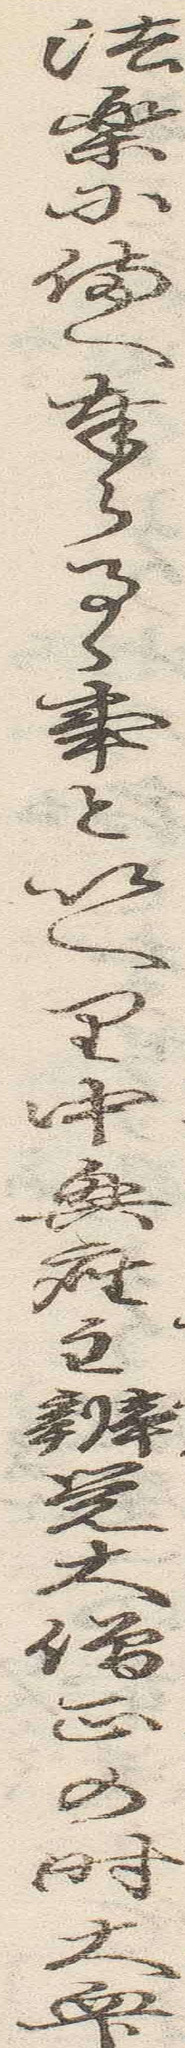法楽に備へ奉らるゝ事といへり中興座主辨覚大僧正の时大衆
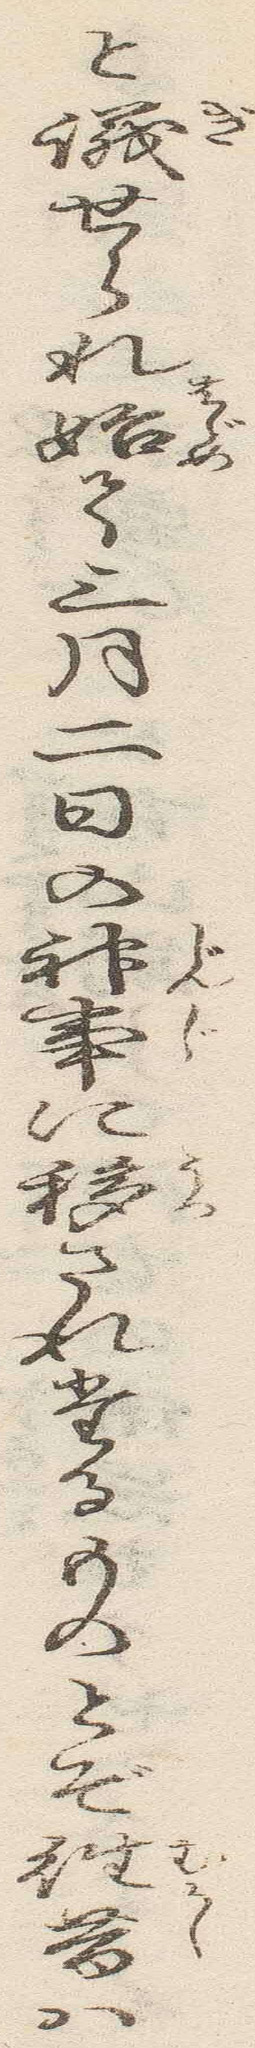と議せられ始て三月二日の神事に移されたるものとぞ徃昔は
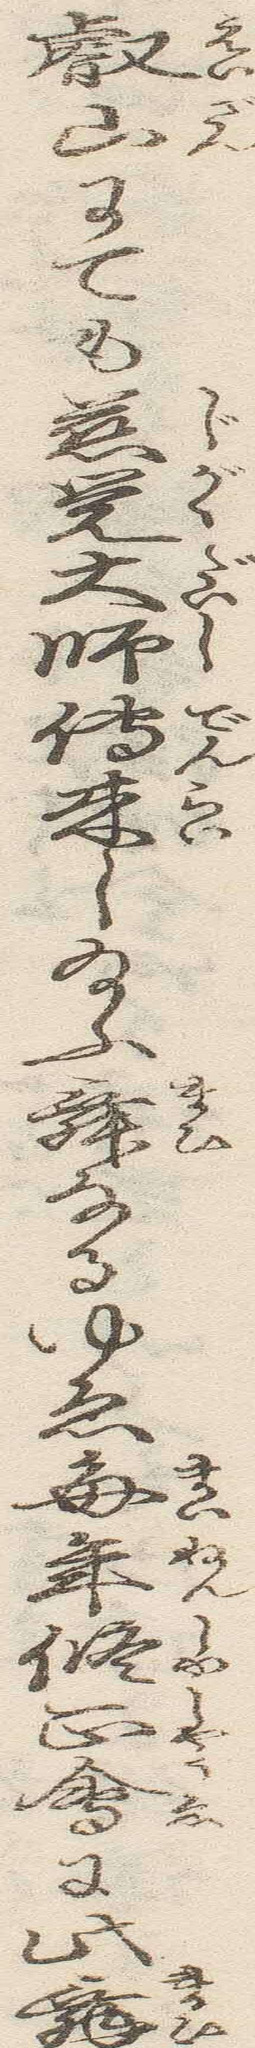叡山にても慈覚大師傳来し給ふ舞なるゆゑ每年修正會に此舞
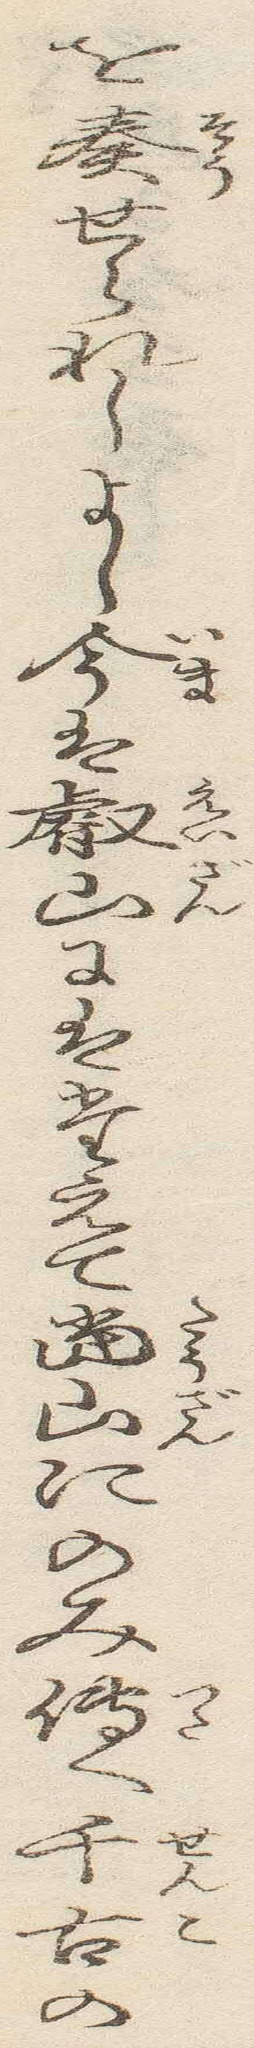を奏せられしよし今は叡山にはたえて當山にのみ傳へ千古の
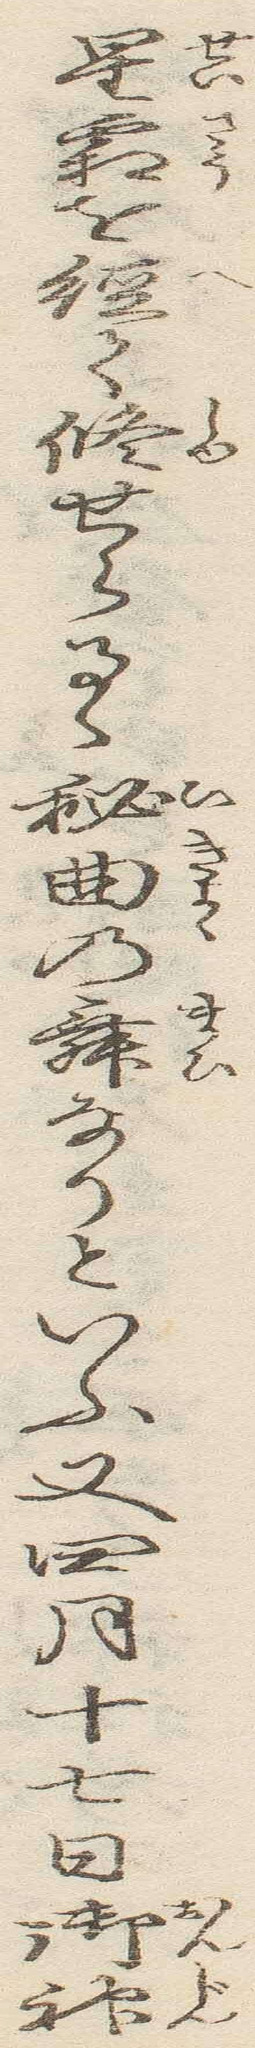星霜を經て修せらるゝ秘曲の舞なりといふ又四月十七日御神
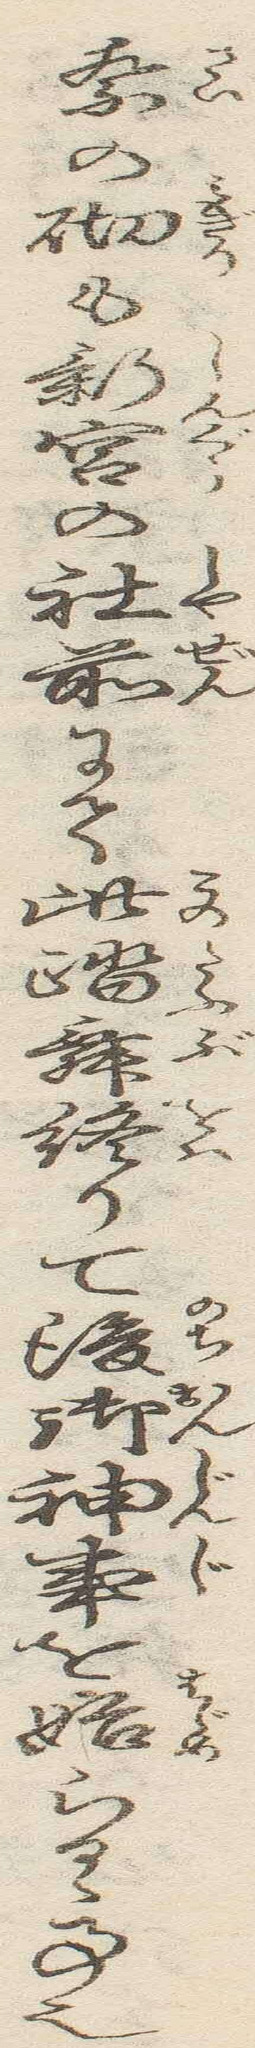祭の砌も新宮の社前にて此踏舞終りて後御神事を始らるゝ事也
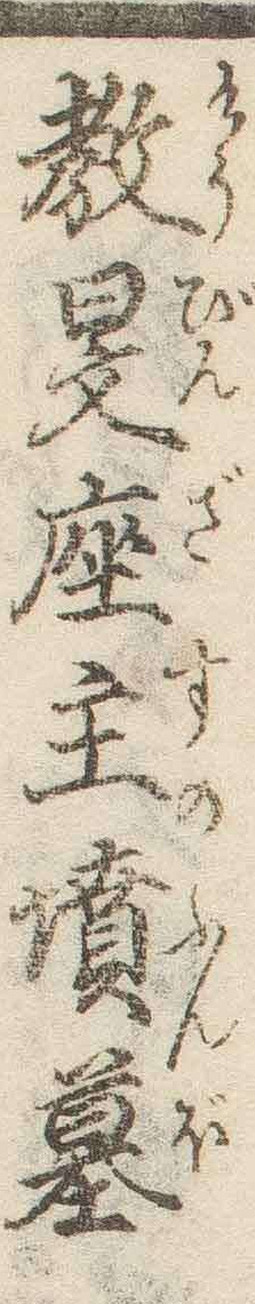教旻座主墳墓
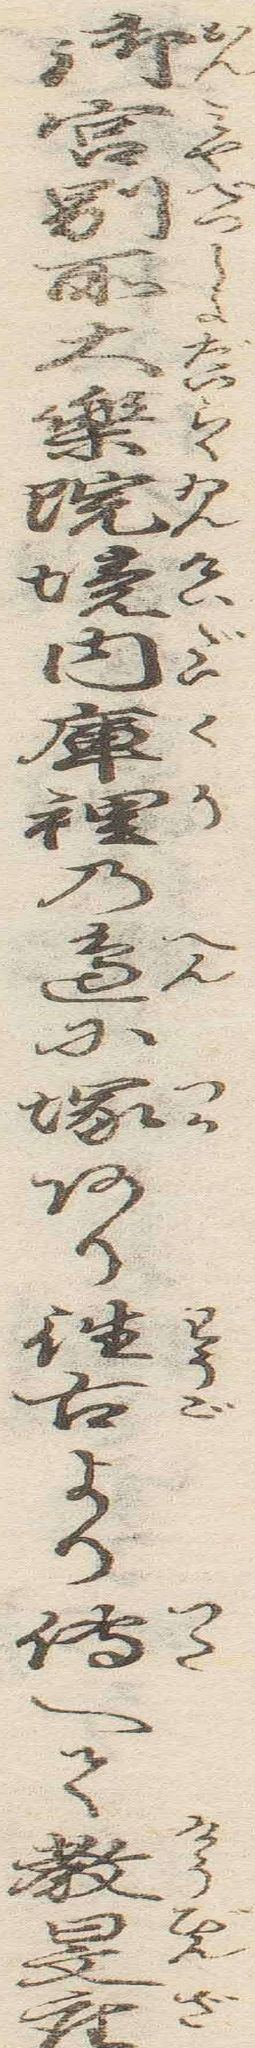御宮別所大樂院境内庫裡の邊に塚あり徃古より傳へて敎旻座
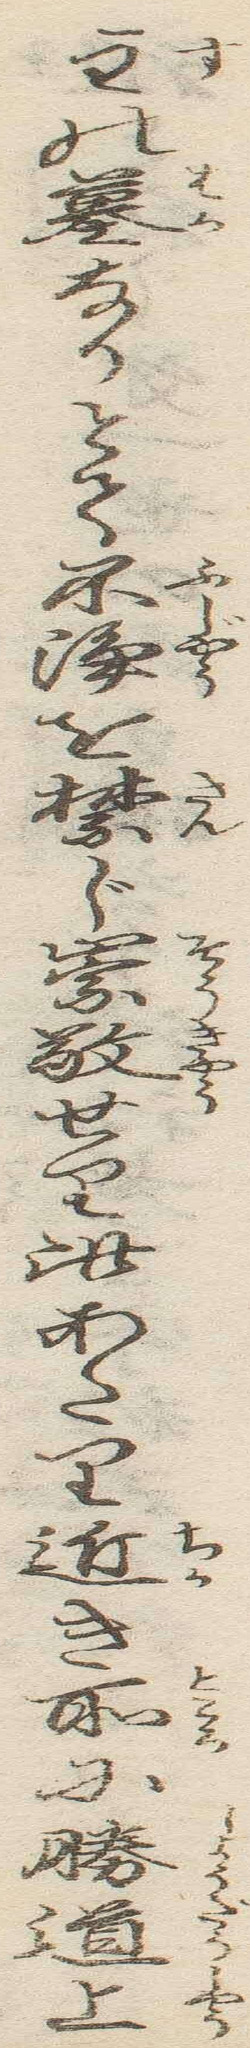主の墓なりとて不浄を禁じ崇敬せり此あたり近き所に勝道上
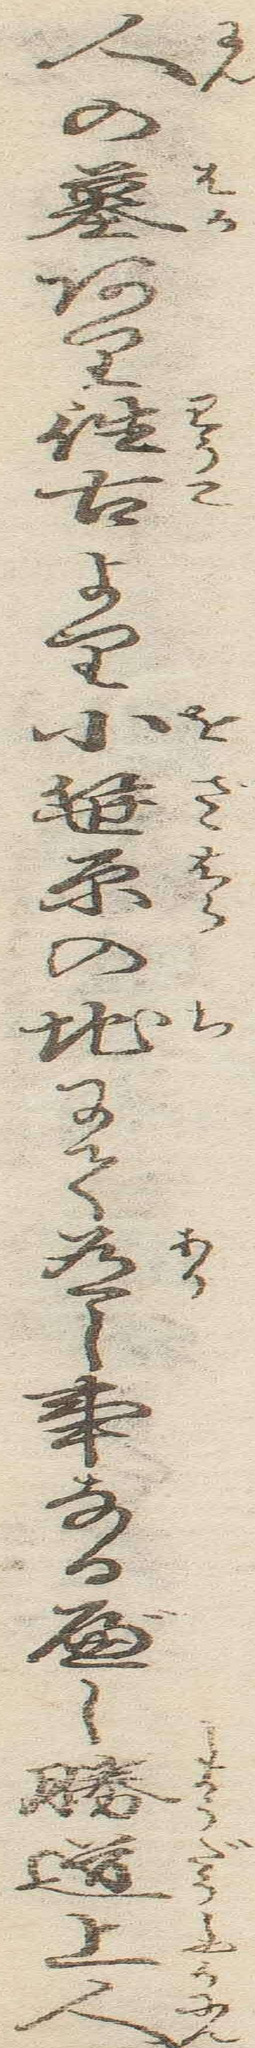人の墓あり徃古より小笹原の地にて有し事なるべし勝道上人
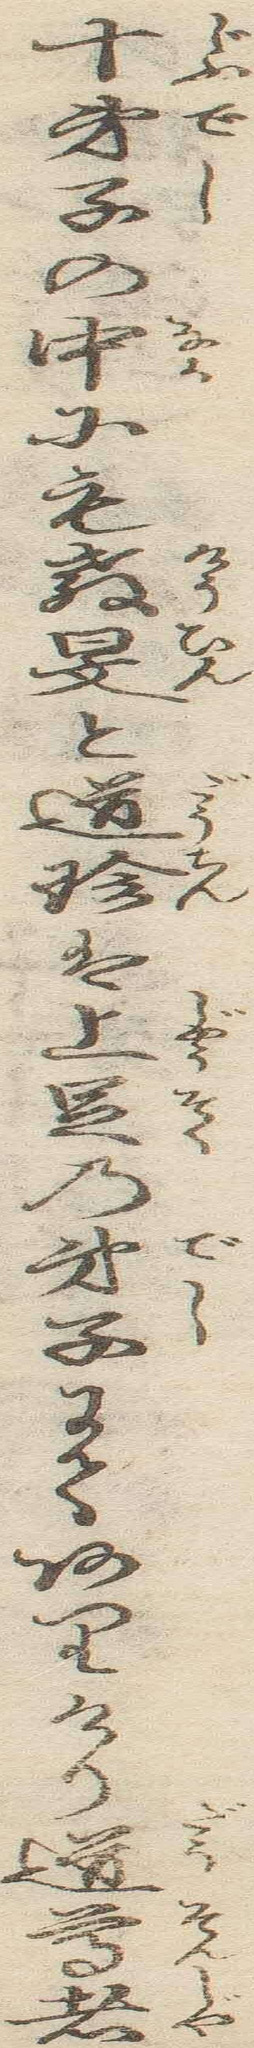十㐧子の中にも敎旻と道珍は上足の㐧子にてありけり道尊者

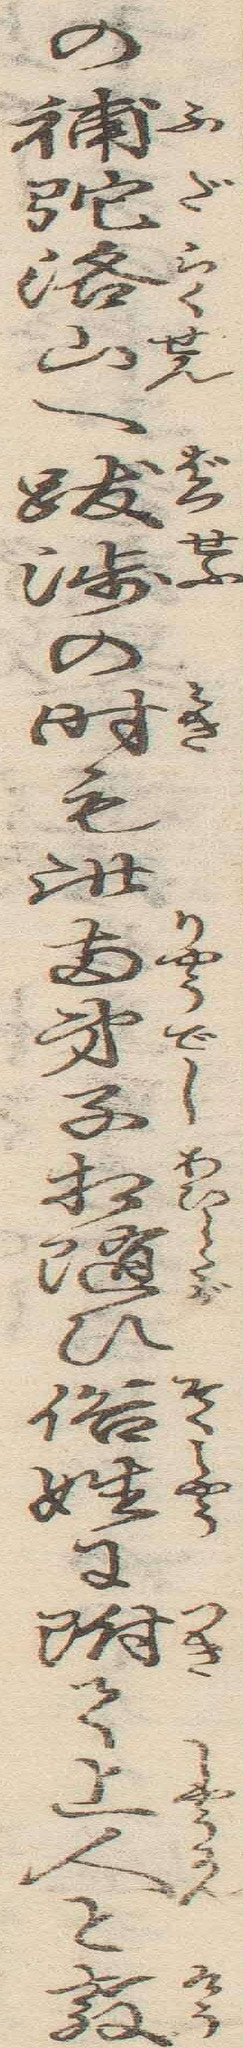の補𢏋洛山へ跋涉の时も此両㐧子相随ひ俗姓に附て上人と敎
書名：日光山志
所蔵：東京学芸大学附属図書館 国文学研究資料館
